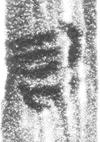君
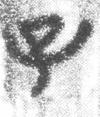子
